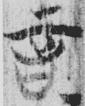言
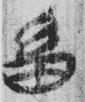畜
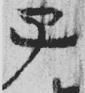子
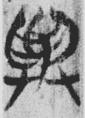與
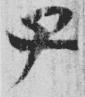子
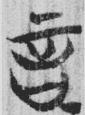言
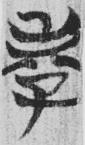孝
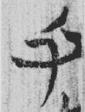父
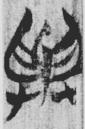與
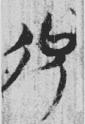○（兄）
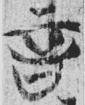言
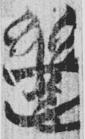○（慈）
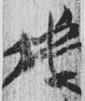俤（弟）
